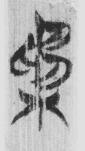柔
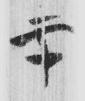丂
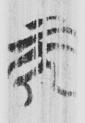而
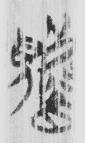{見睿}
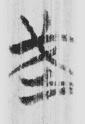武
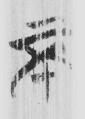不
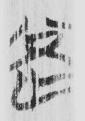罔
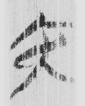夭
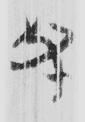屯
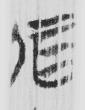{人亘}
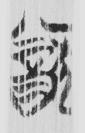猶
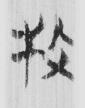牧
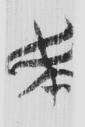民
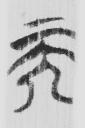而
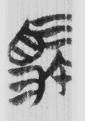{馬午}
